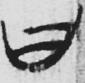曰
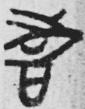○（詩）
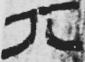亓（其）
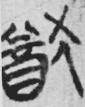猶
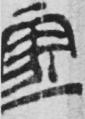坪（平）
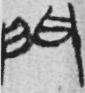門
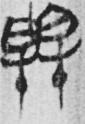與
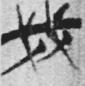戔
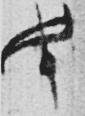民
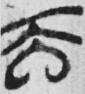而
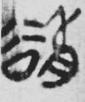○（裕）
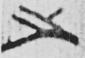之
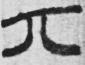亓（其）
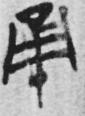甬（用）
